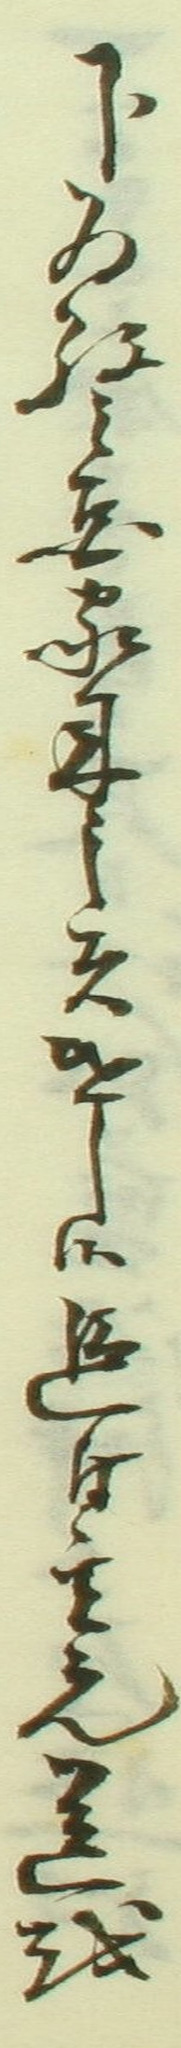下為警固家来之者遣し候追付其元送越
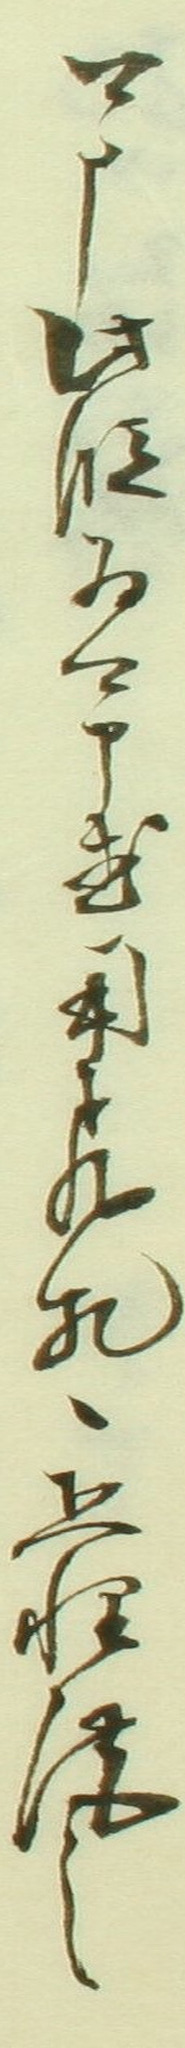可申此段為可申置用飛札候恐惶謹言
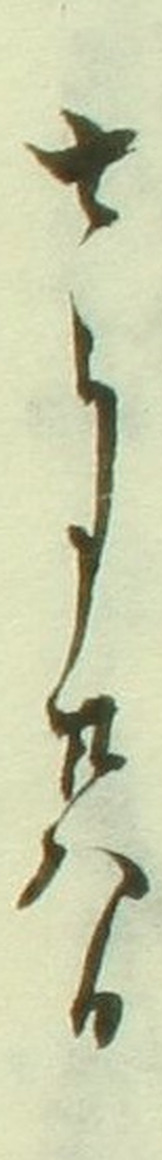七月廿八日
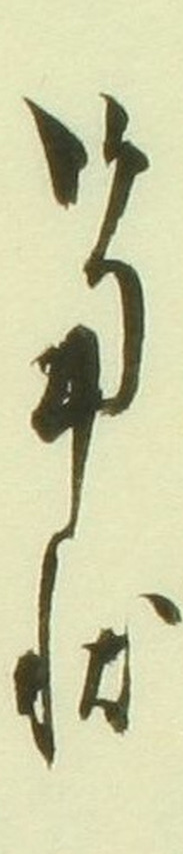御用状
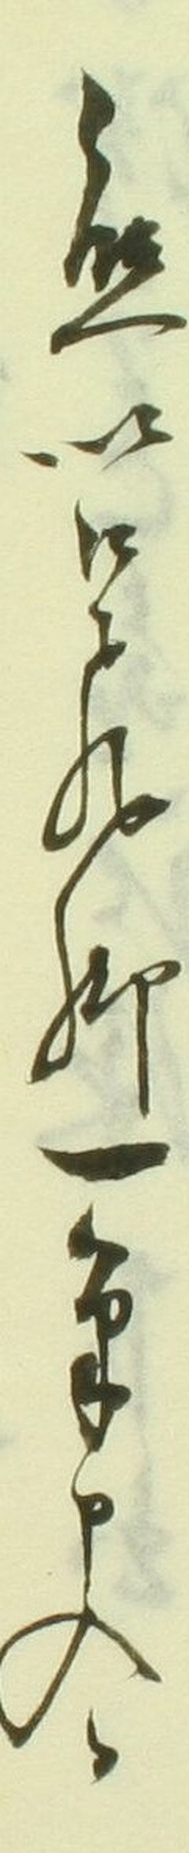態以御飛脚一筆申入候
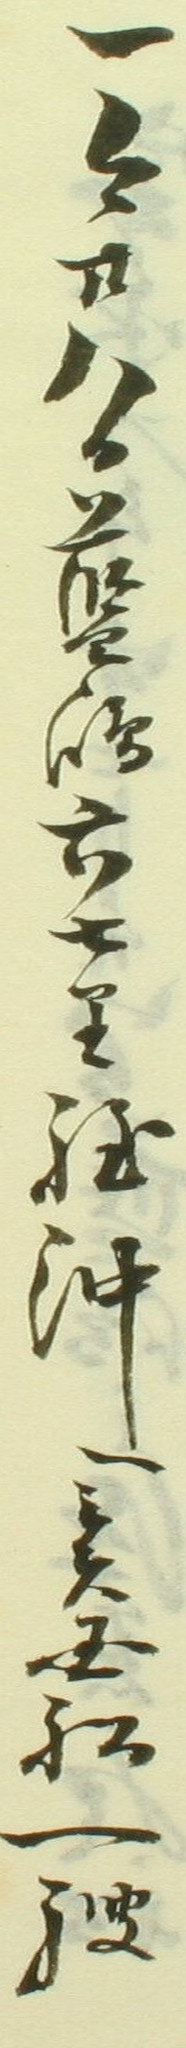一今廿八日藍嶋六七里程沖へ異国船一艘
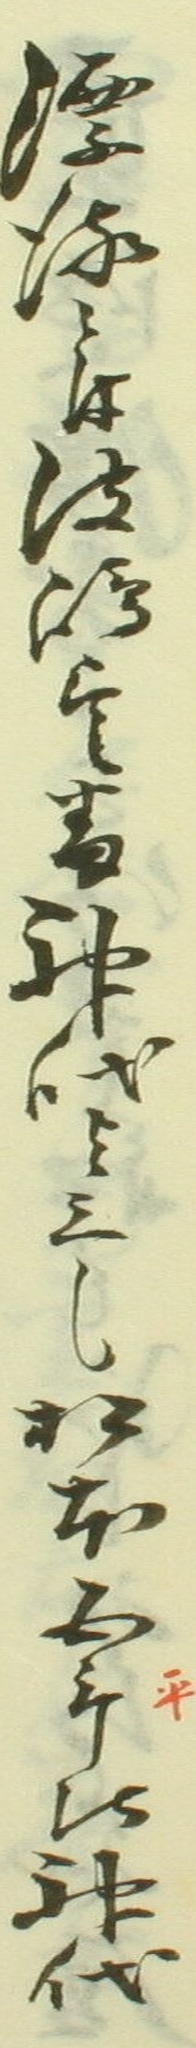漂流ニ付波嶋定番神代与三松本五平次神代
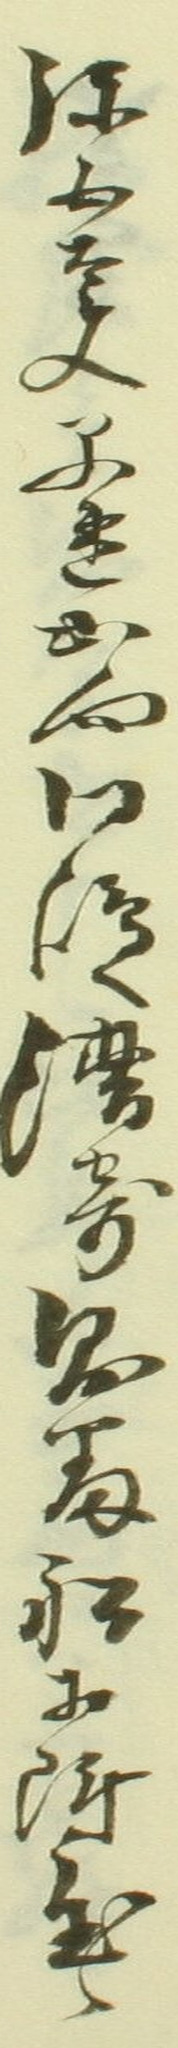弥五太夫早速出向同嶋へ漕寄則番船相附置候
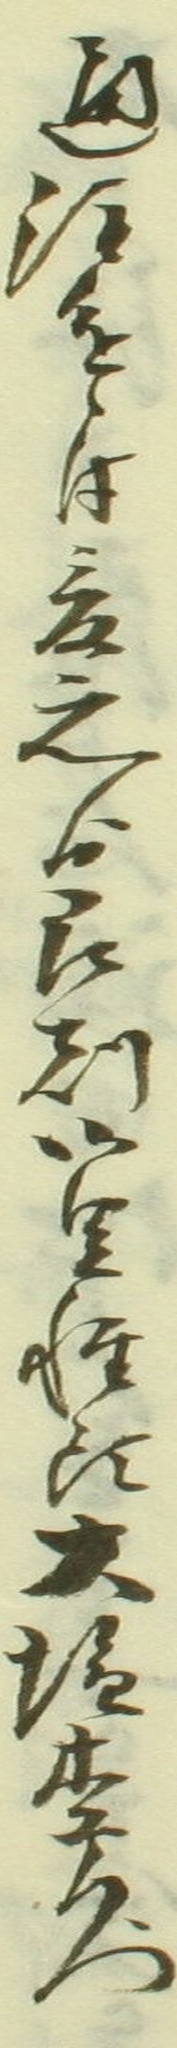通注進候付爰元ゟ即刻御足軽頭大塩杢左衛門
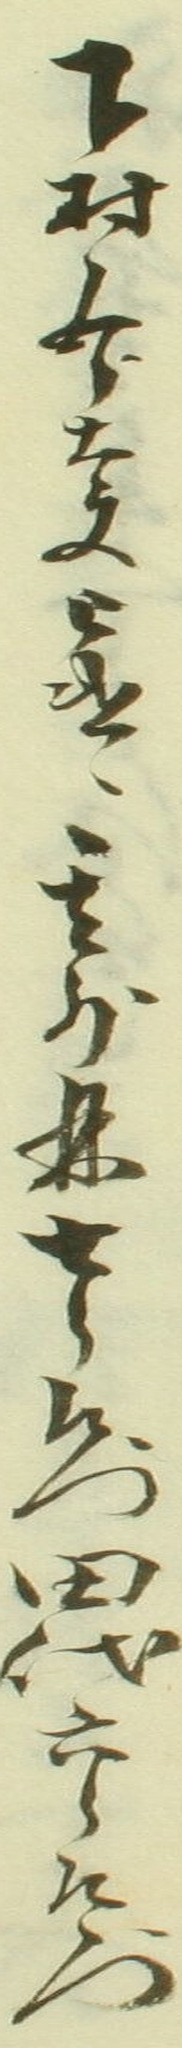下村五郎太夫被遣候其外林七郎左衛門田代六郎左衛門
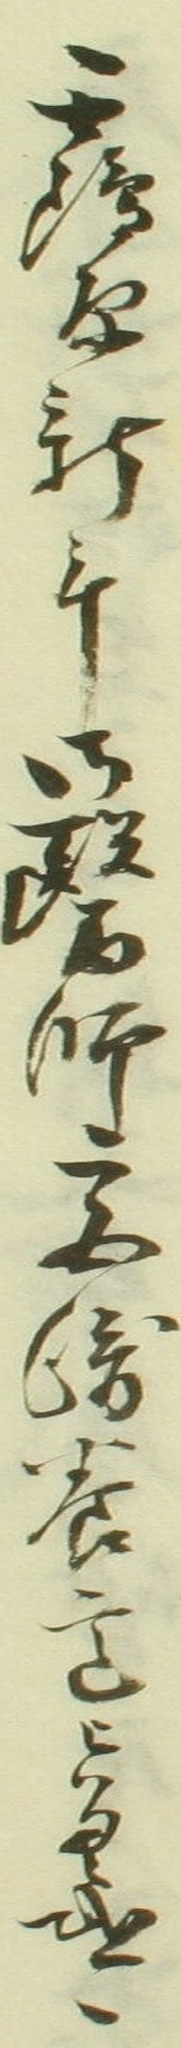靏原新平御医師宮崎養意被差遣候
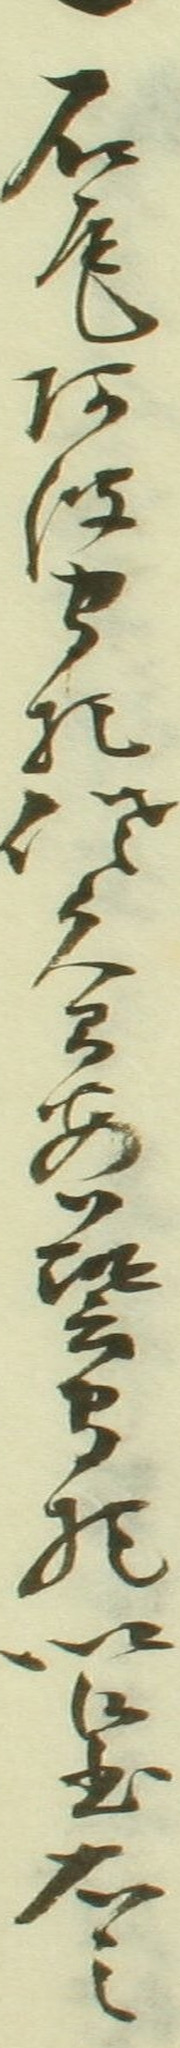一石尾阿波守様佐久間安芸守様以御書右之
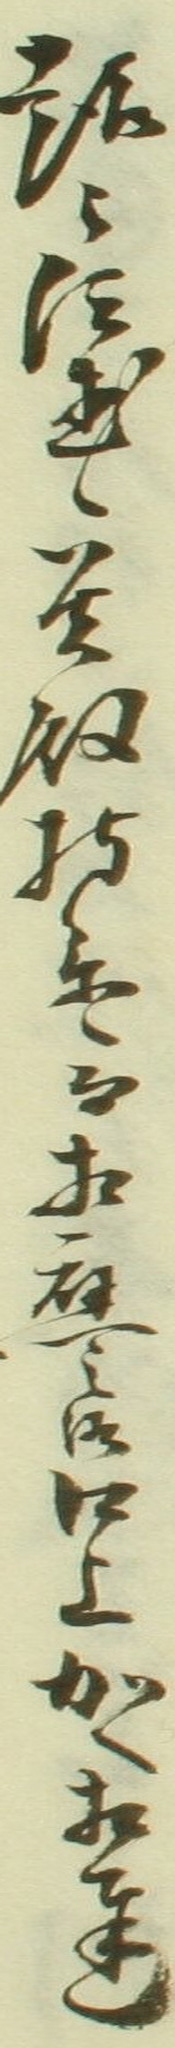趣被仰置候貴殿持参候而相応之御口上加へ相達
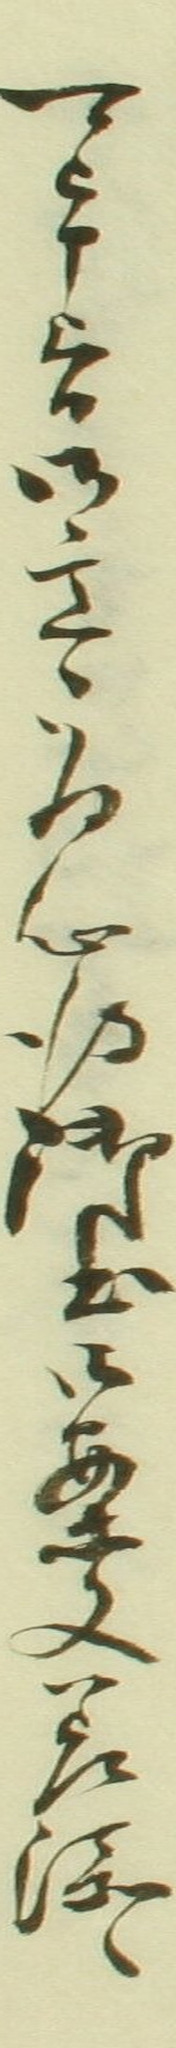可被申旨御意候為心得御書御案文差添候
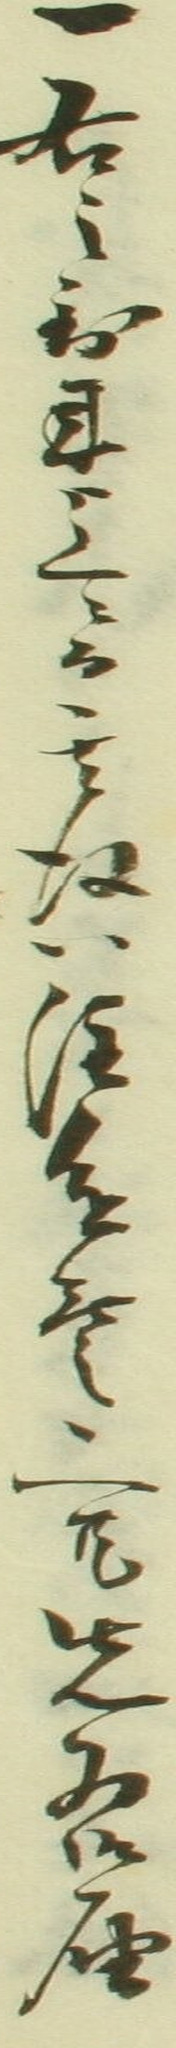一右之到来上ニ而其存ハ注進無之候へ共先為御届

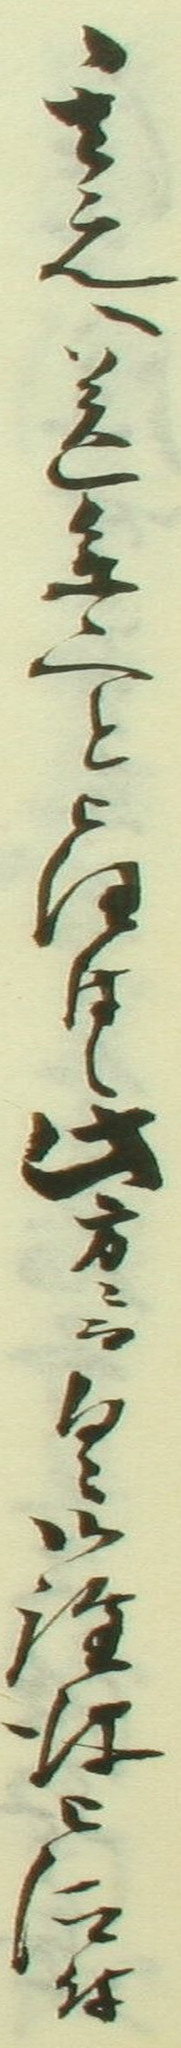其元へ送参候へと被任付候此方ニ而具御詮議被仰付
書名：異国船漂着記
